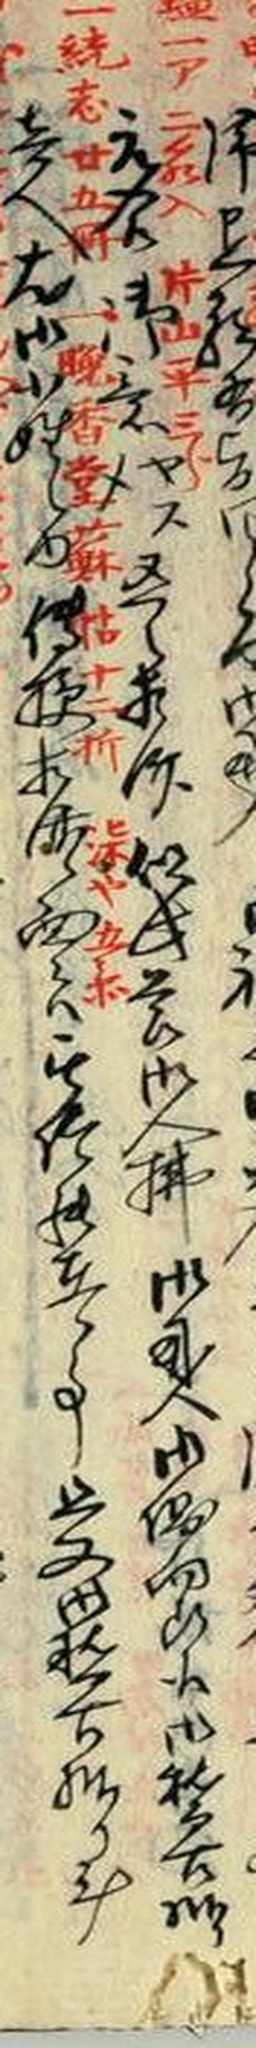壱人尤御小姓之内伝授相済候面々ハ其儘罷在候事且又御稽古掛り斗
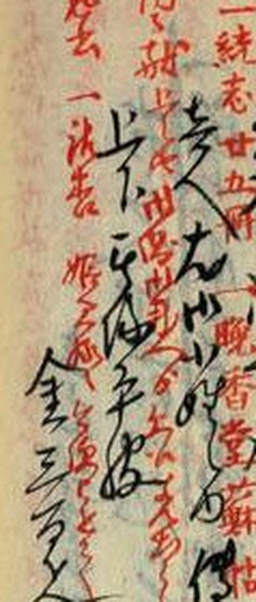上下其余平服
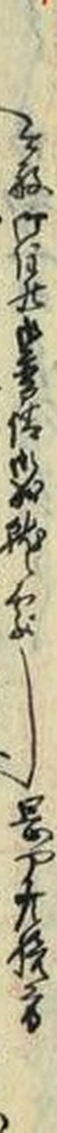今般御住居御普請御成就之処
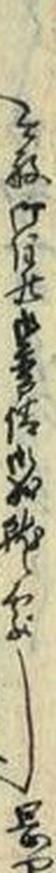今般御住居御普請御成就之処
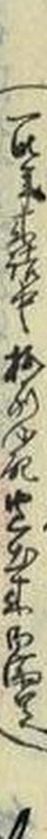一昨年来詰中格別心配宜出来御満足
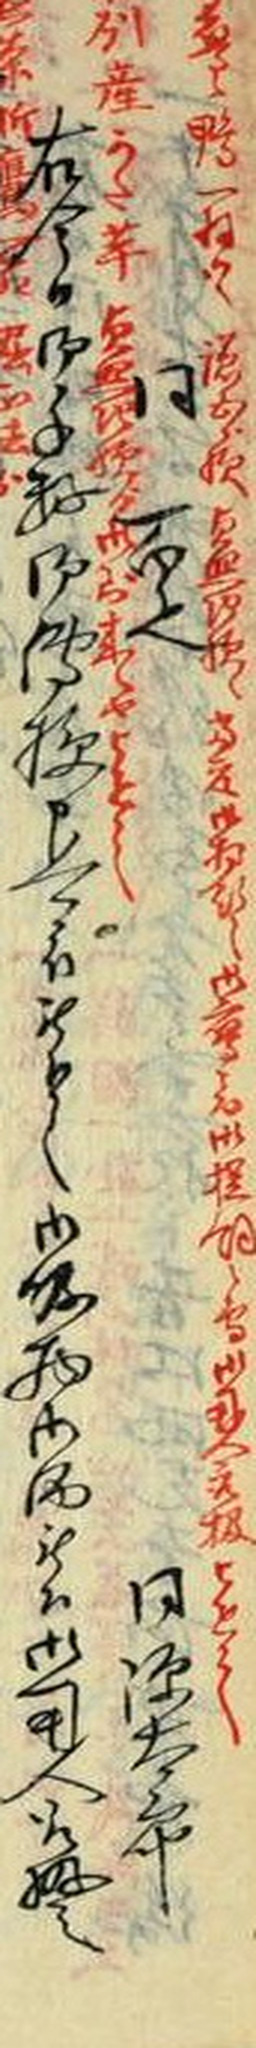右今日御手数御伝授申上候ニ付被下之御吸物御酒被下御用人取扱之
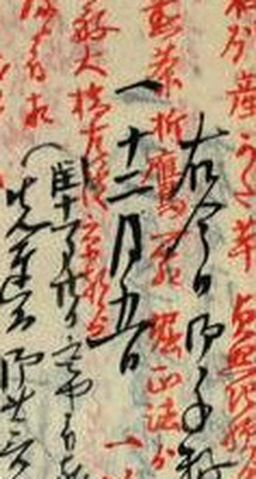一十二月五日
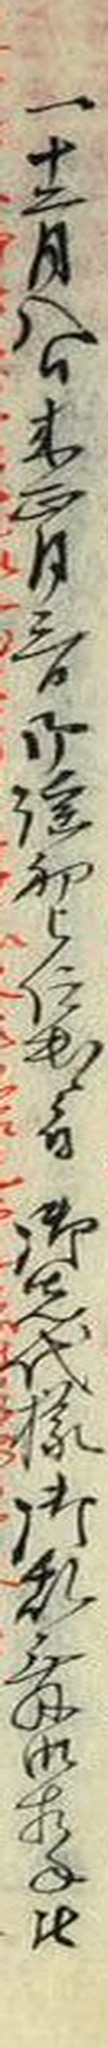一十二月八日来正月三日御謡初被仰出候ニ付御先代様御乱舞御相手被
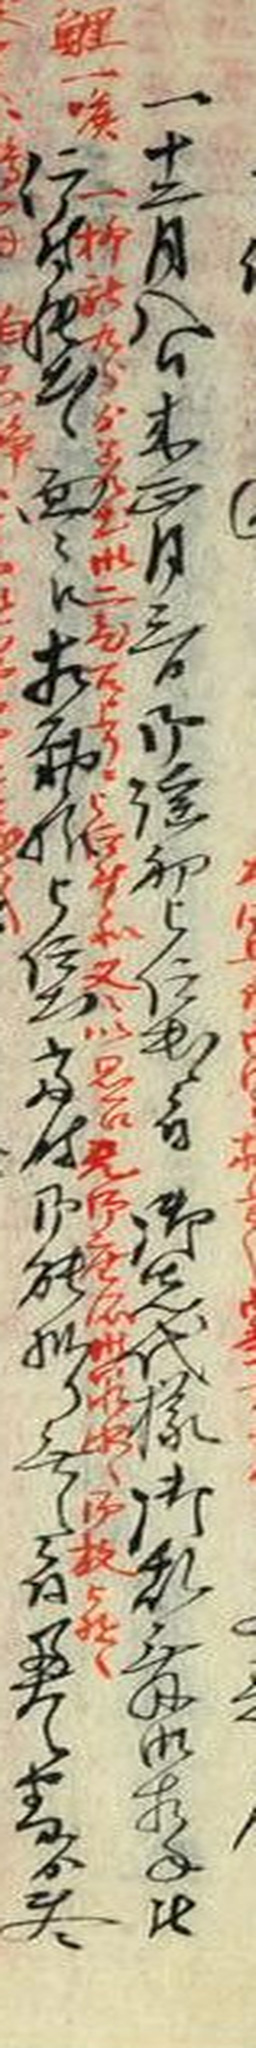仰付罷出面々江相勤候様被仰出当時御能掛り無之ニ付奥之番ゟ夫々
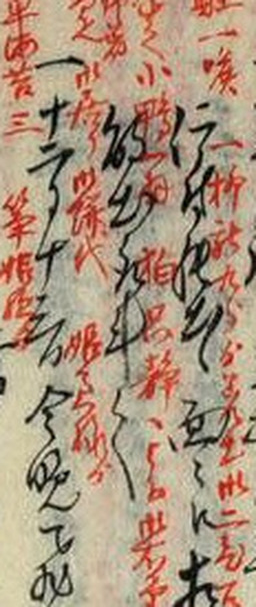触出取計之
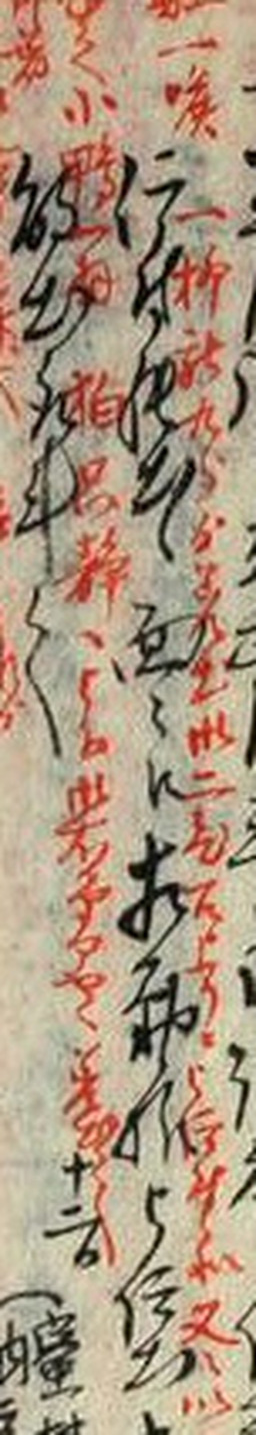触出取計之
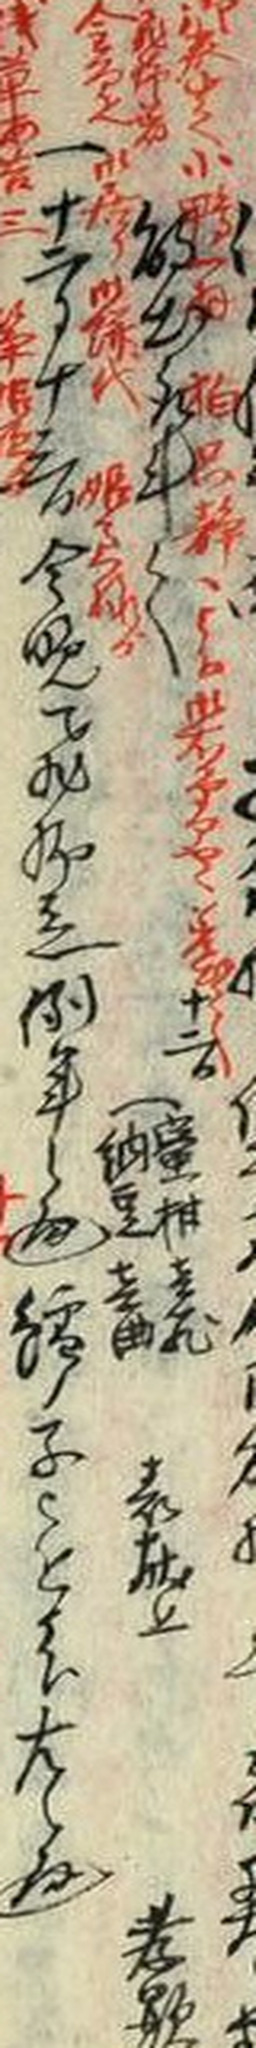一十二月十三日今晩飛脚立例年之通鱈子被進被下左之通
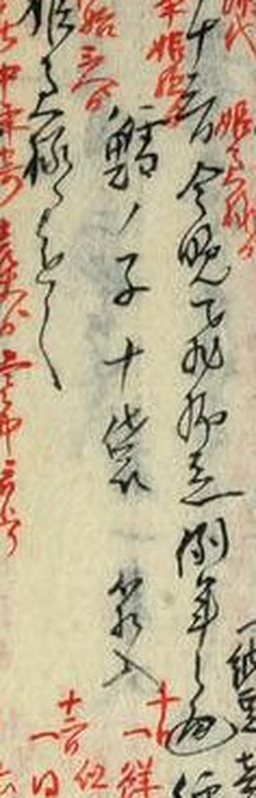鱈ノ子十袋箱入
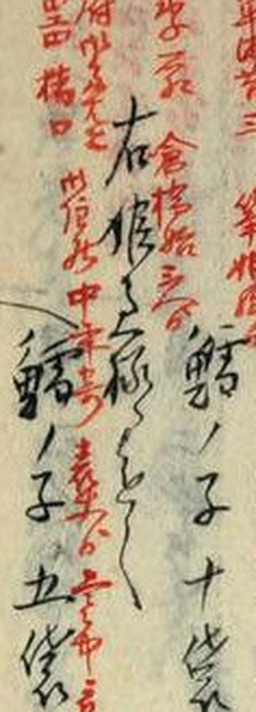右姫君様へ被進之

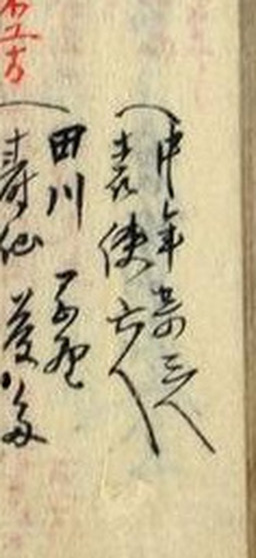表使六人
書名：少傅日録抄（斉承付側向頭取日記、在国）
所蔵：福井県文書館 Fukui Prefectural Archives
